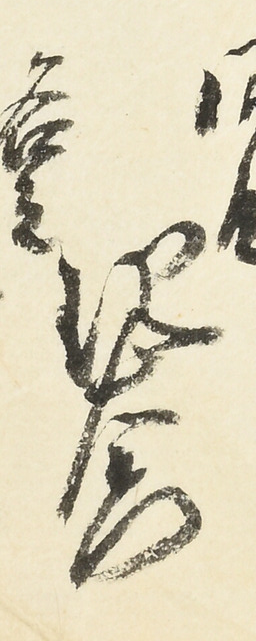宿金右衛門
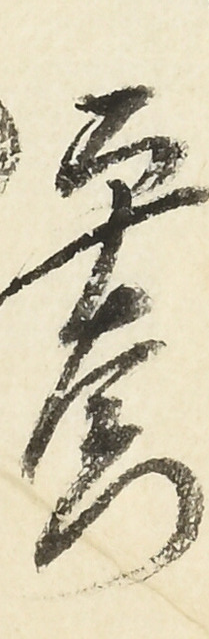平右衛門

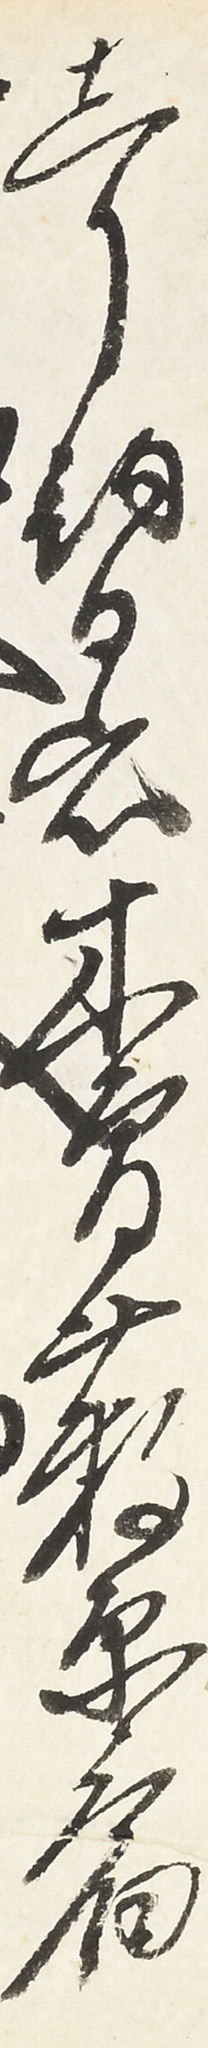十二月朔日着木曽藪原宿
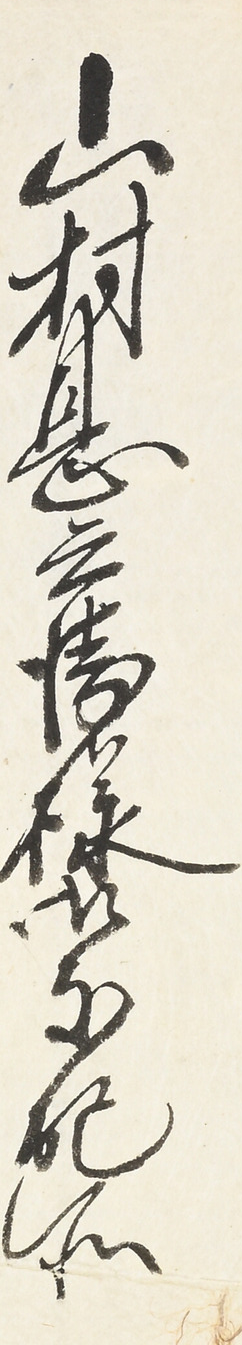山村甚兵衛様御支配所
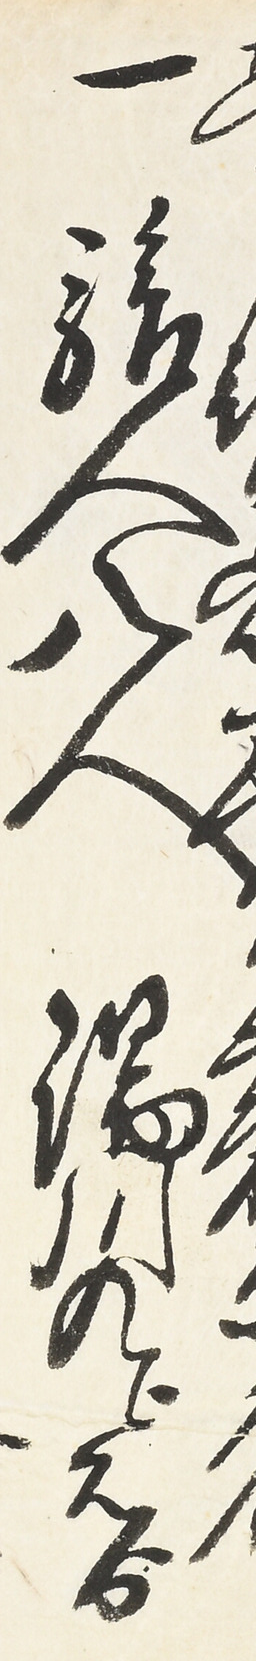一旅人八人湯川九郎右衛門
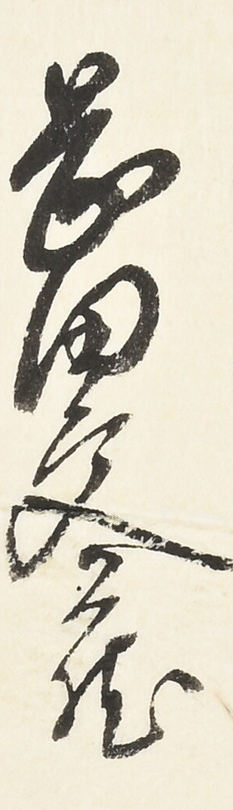岡田文蔵
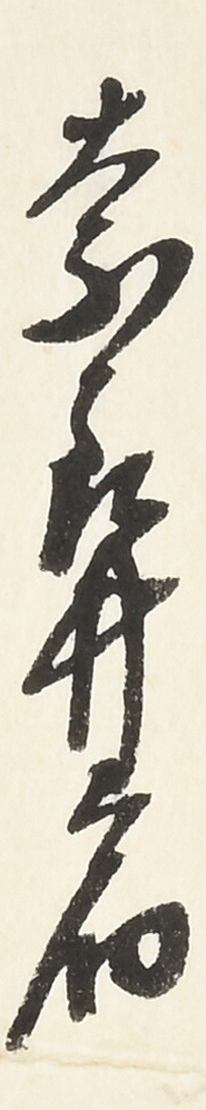奈良井宿
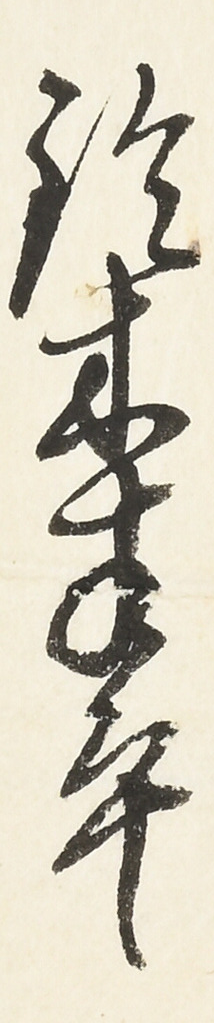鈴木半平
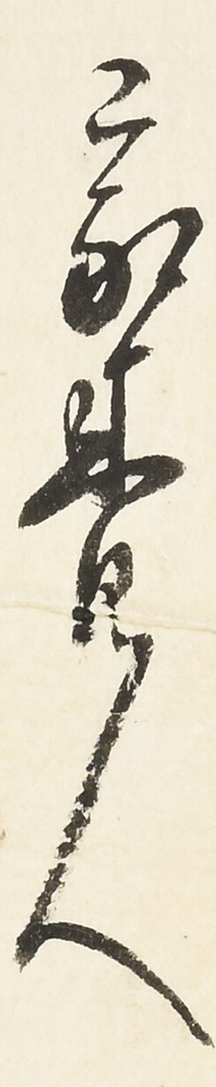家来四人
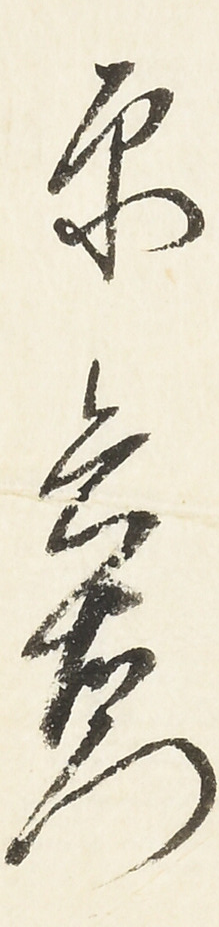原兵右衛門
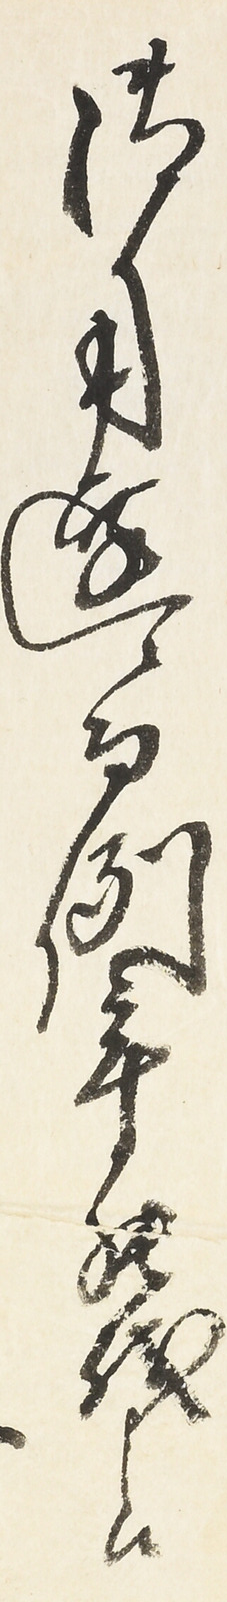御用達ニ而例年罷越申候
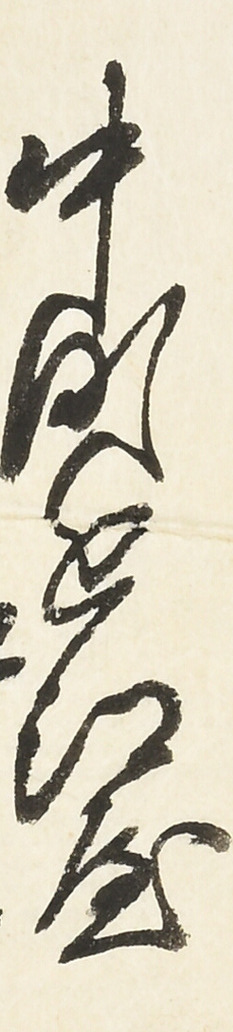中町近江屋
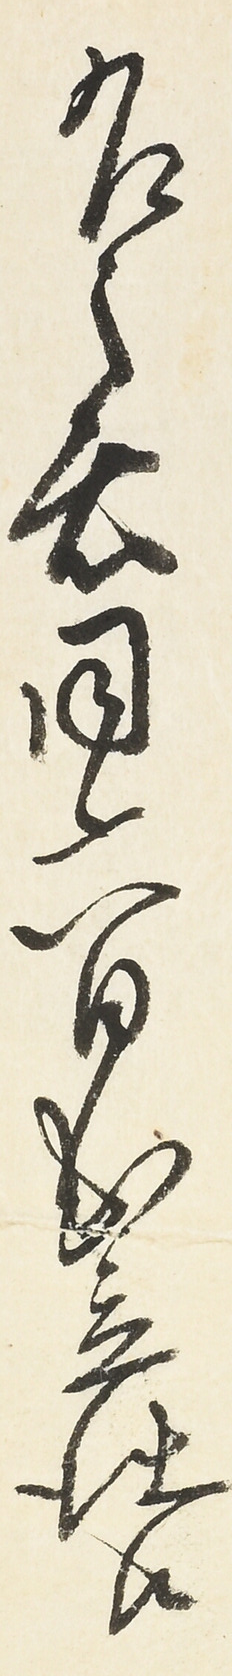右之者同六日出立仕候
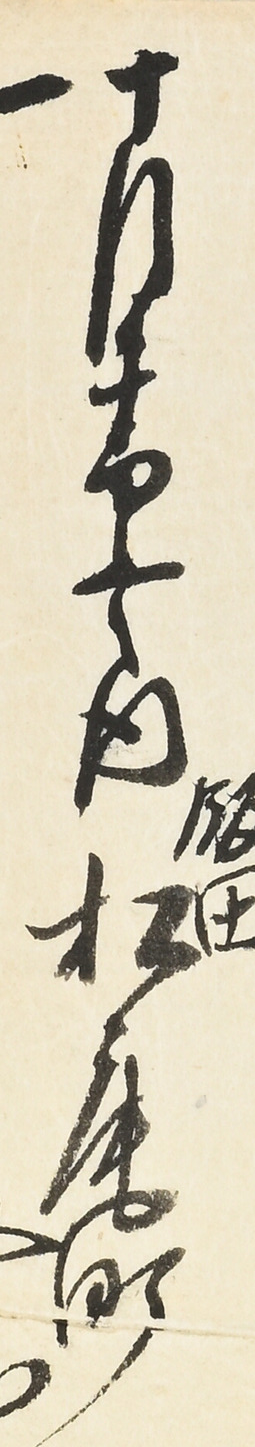十月書上之内松尾町
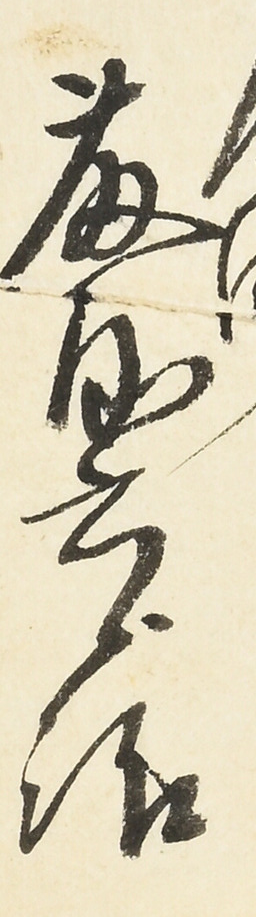藤屋六郎治
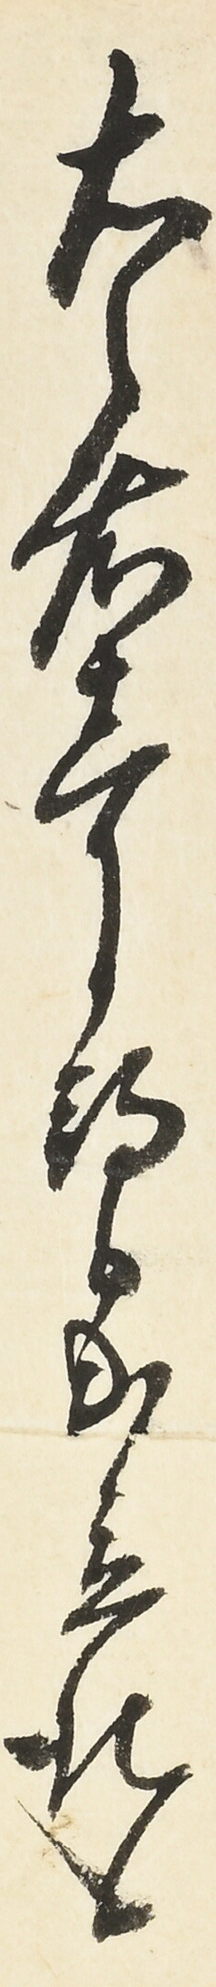右之者十二月朔日出立仕候
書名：町中旅人泊控帳
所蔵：伊那市立高遠町図書館・合同会社AMANE
